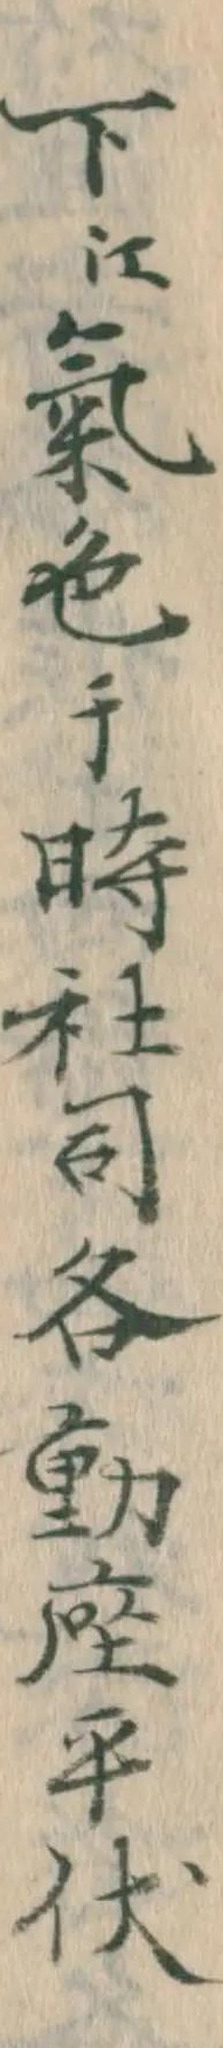下江気色于時社司各動座平伏

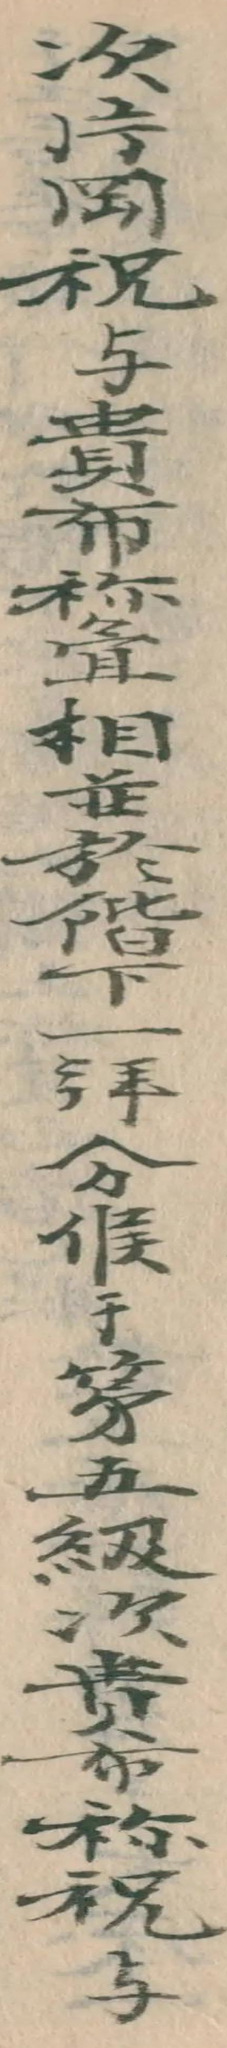次片岡祝与貴ふ々祢宜相並於階下一拝分候于第五級次貴ふね祝与
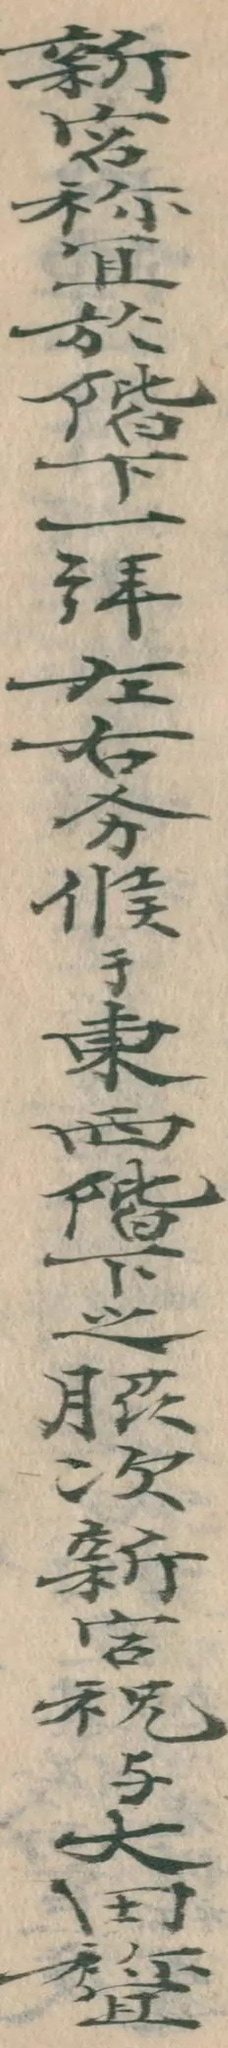新宮祢宜於階下一拝左右分候于東西階下之脇次新宮祝与大田祢宜
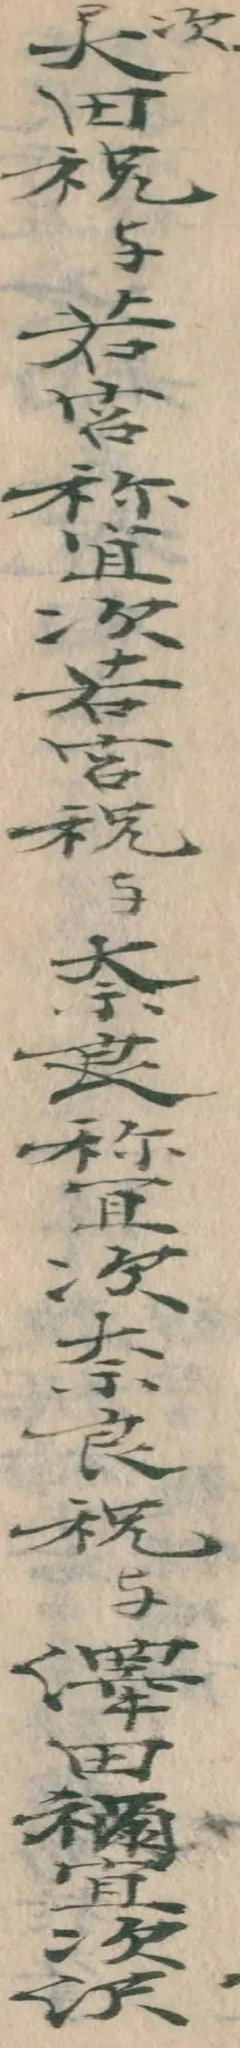◦大田祝与若宮祢宜次若宮祝与奈良称宜次奈良祝与澤田弥宜次沢
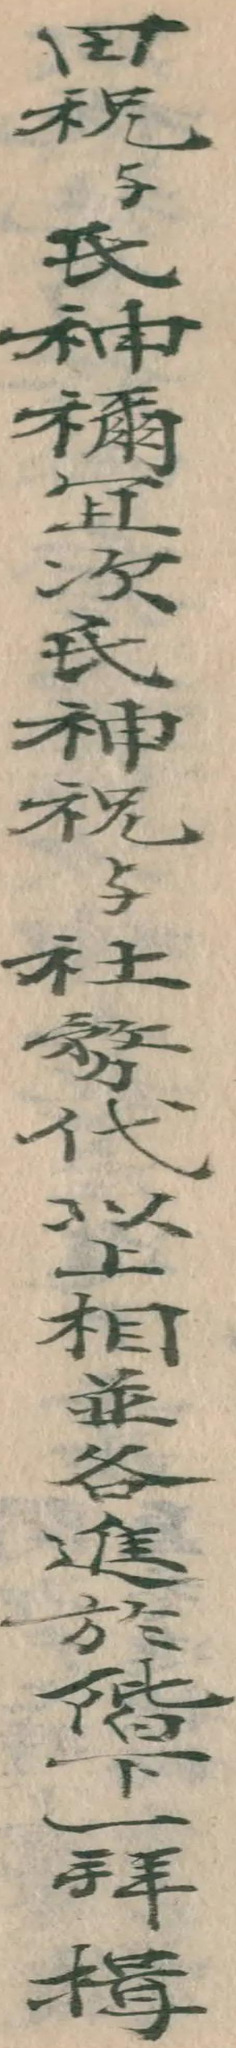田税与氏神称宜次氏神祝与社務代以上相並各進於階下一拝揖
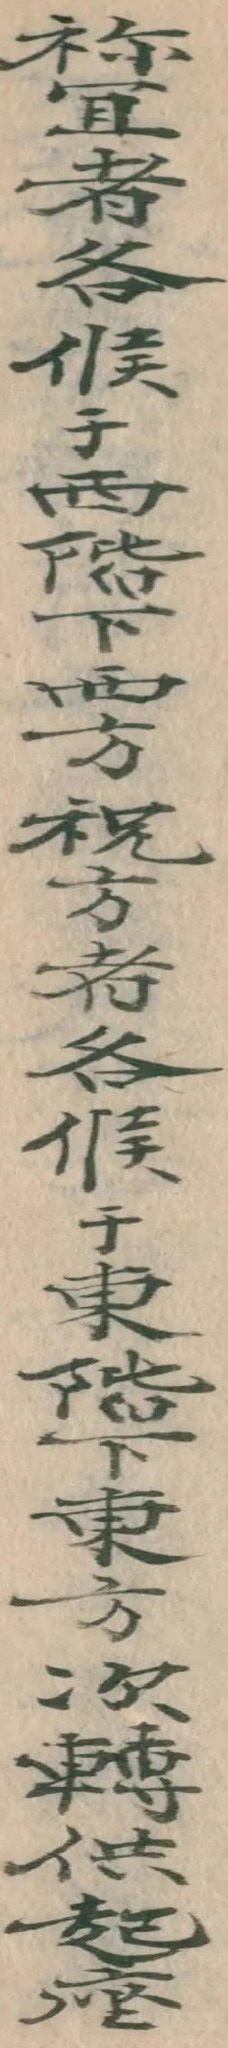称宜者各候于西階下西方祝方者各侯于東階下東方次転供起座
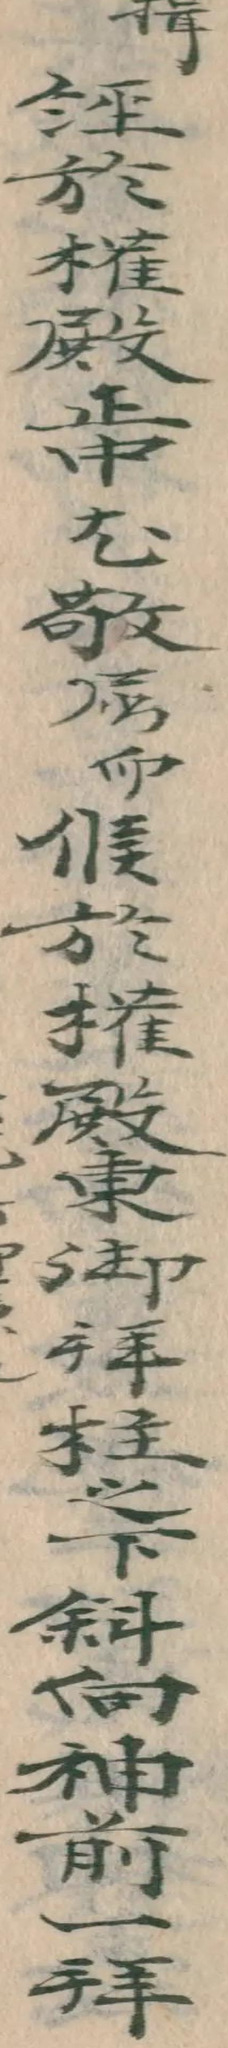座揖経於権殿正中尤敬屈而候於権殿東御拝柱之下斜向神前一拝
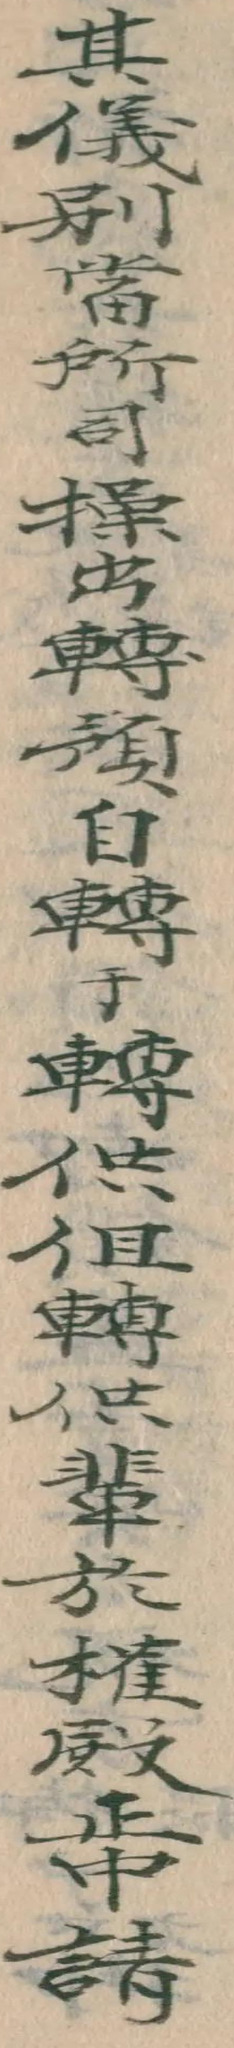其儀別当所司操出転預自転于転供但転供輩於権殿正中請
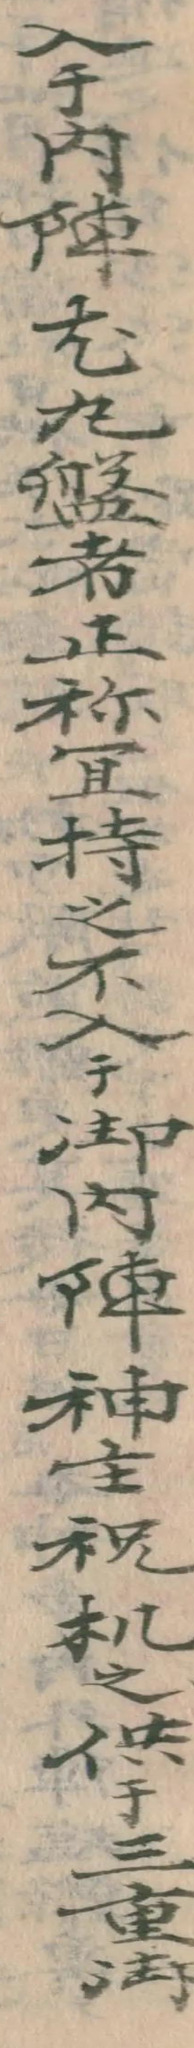入于内陣尤丸盤者正称宜持之不入于御内陣神主祝机之供于三重御
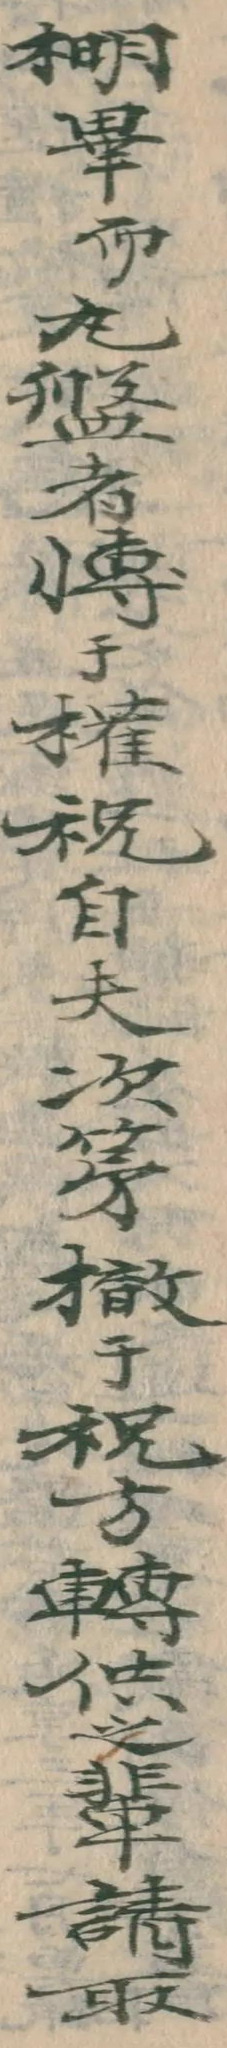棚畢而丸盤者転于権祝自夫次第撤于祝方転供之輩請取
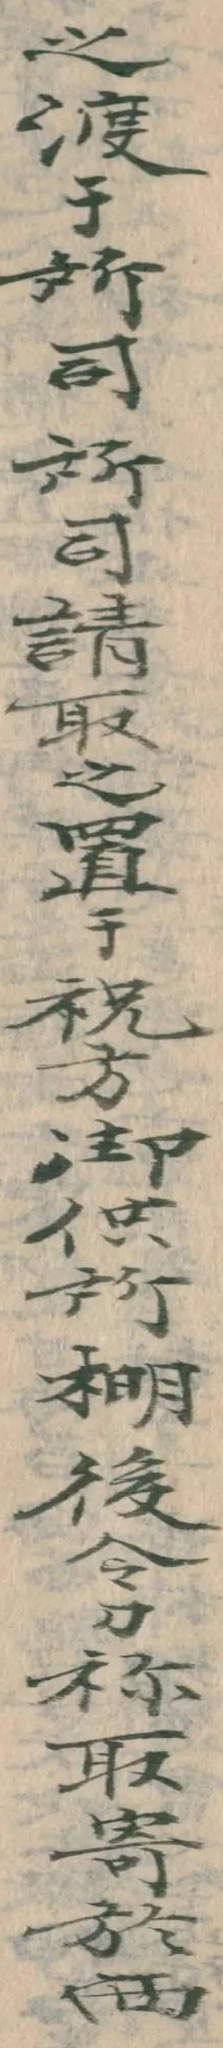之渡于所司所司請取之置于祝方御供所棚後令刀祢取寄於西
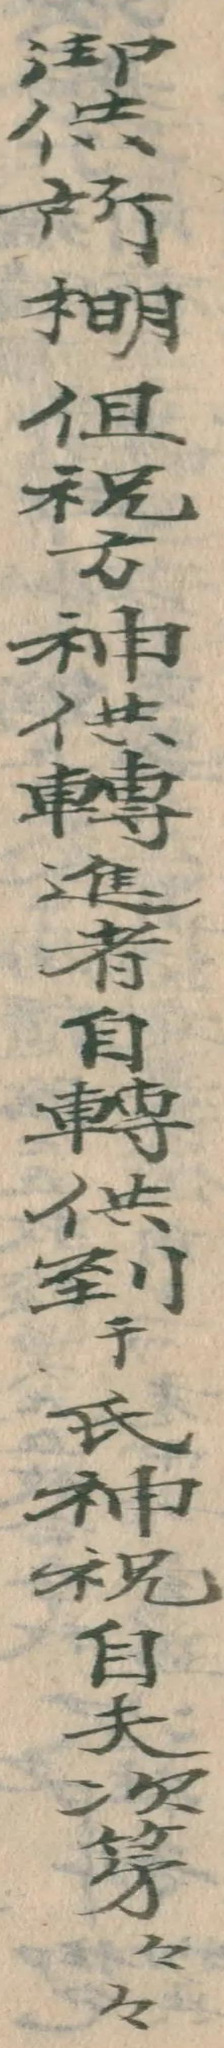御供所棚但祝方神供転進者自転供到于氏神祝自夫次第々々
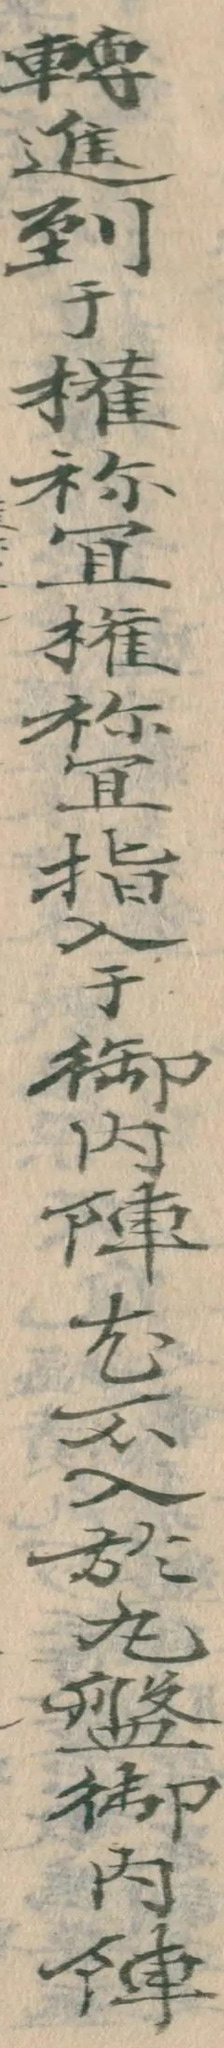転進到于權称宜権祢宜指入于御内陣尤不入於丸盤御内陣
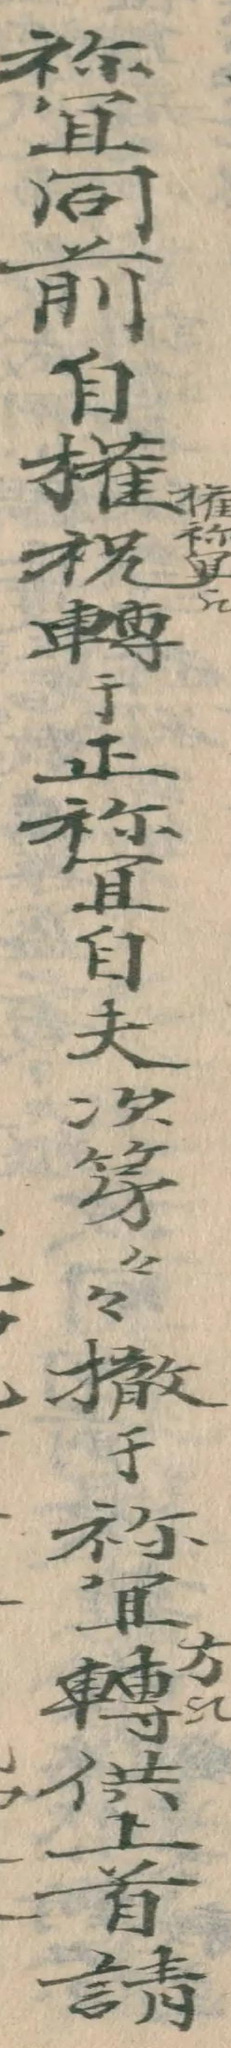称宜同前自権祝転于正称宜自夫次第々々撤于祢宜転供上首請
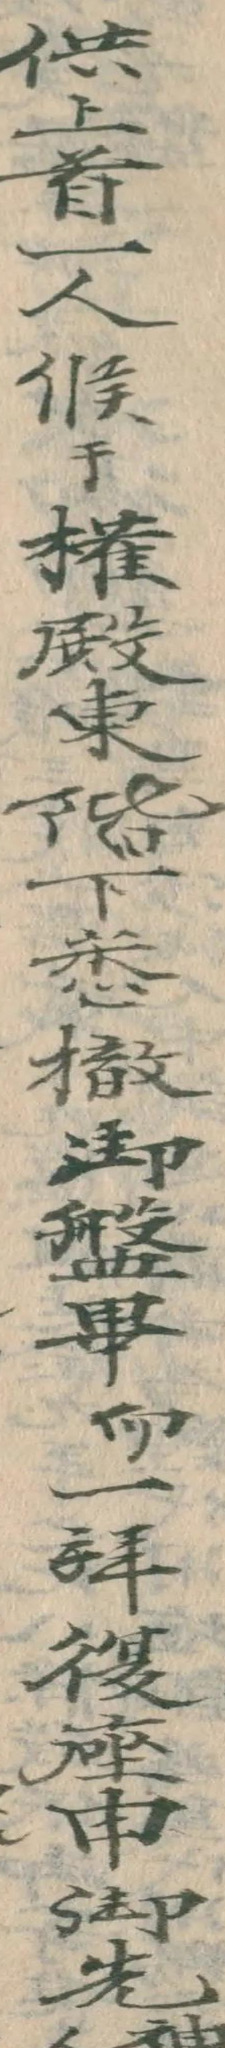供上首一人候于権殿東階下悉撤御盤畢而一拝復座申御先神人

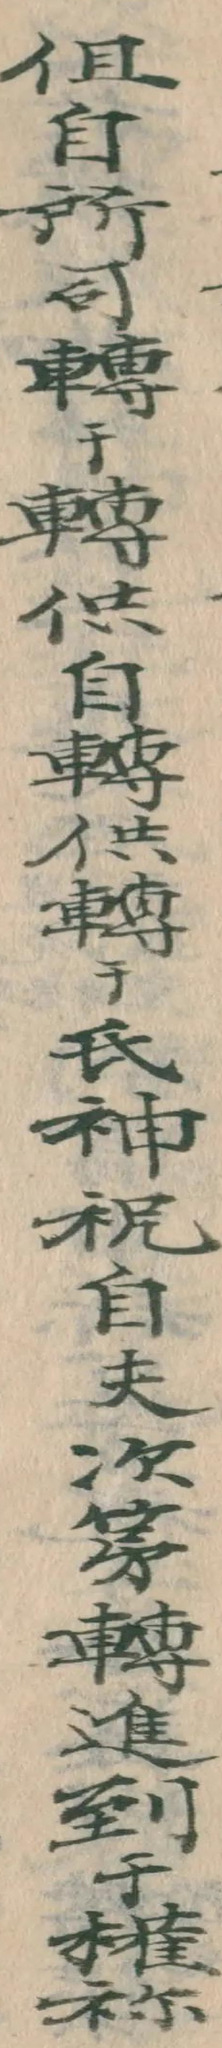但自所司転于転供自転供転于氏神祝自夫次第転進到于権祢
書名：賀茂社記録. 第9冊
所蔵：国立国会図書館 National Diet Library, JAPAN
